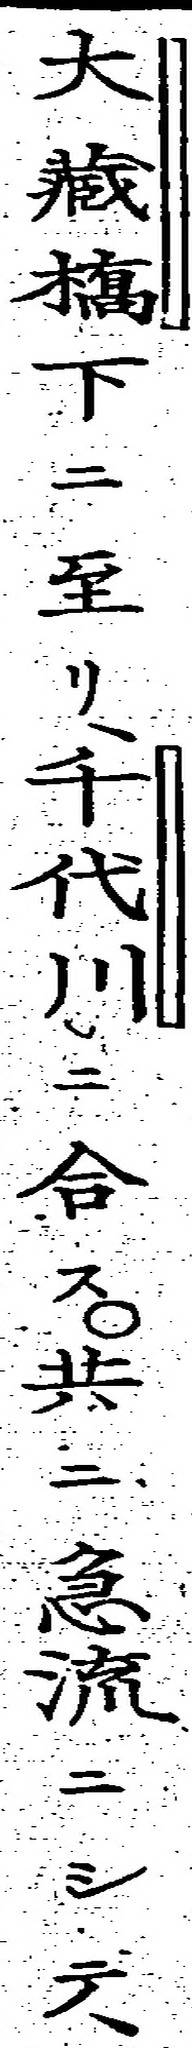大蔵橋下ニ至リ、千代川ニ合ス。共ニ急流ニシテ、
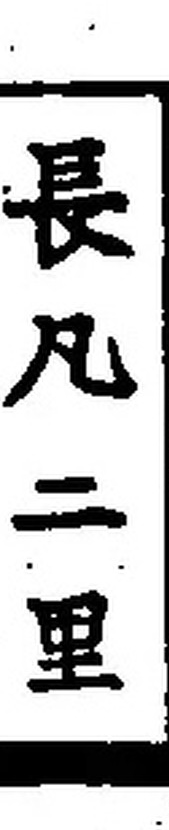長凡二里
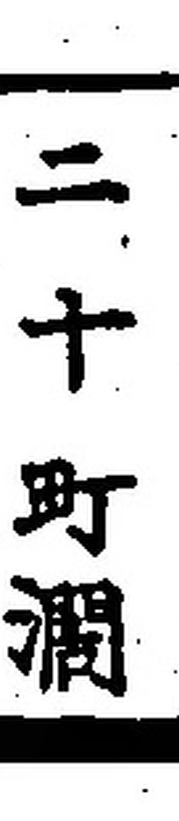二十町闊
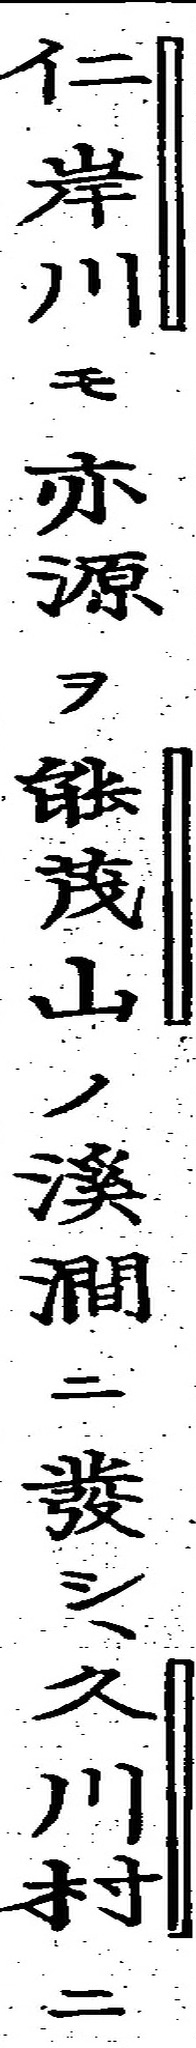仁岸川モ亦源ヲ能茂山ノ渓澗ニ発シ、久川村ニ
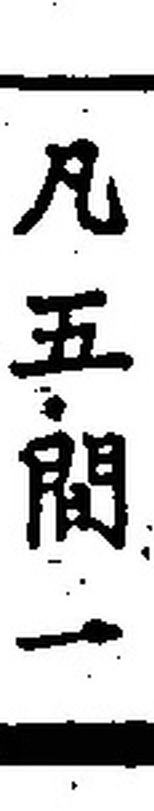凡五間一
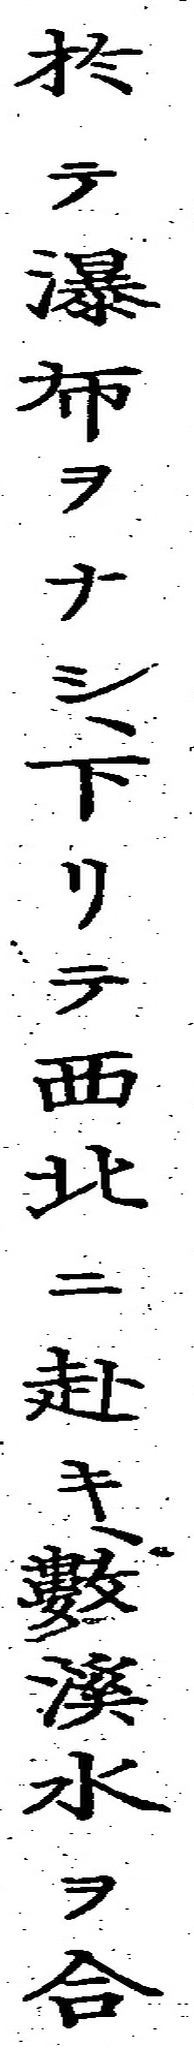於テ瀑布ヲナシ、下リテ西北ニ赴キ、数渓水ヲ合
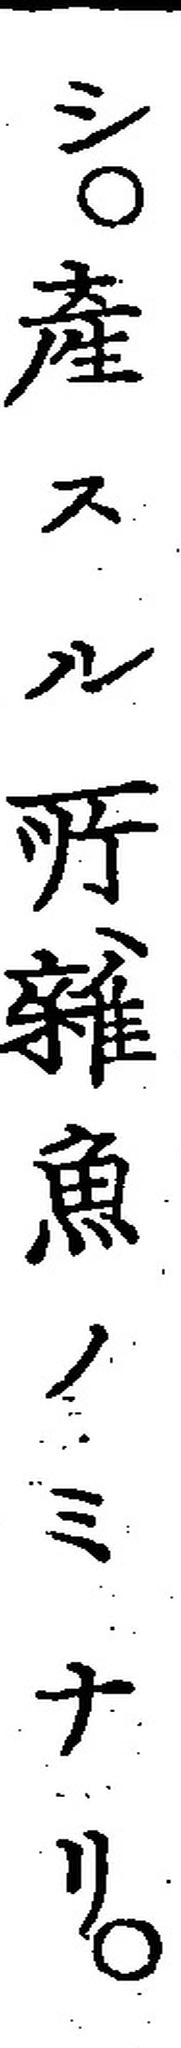シ。産スル所、雑魚ノミナリ。
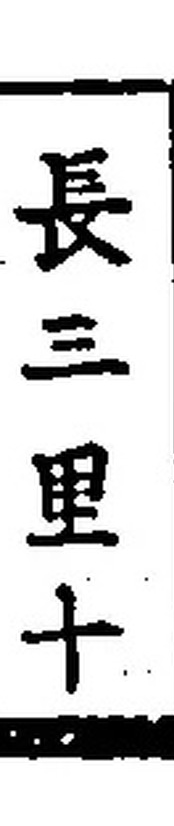長三里十
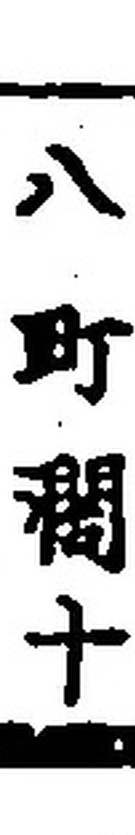八町闊十
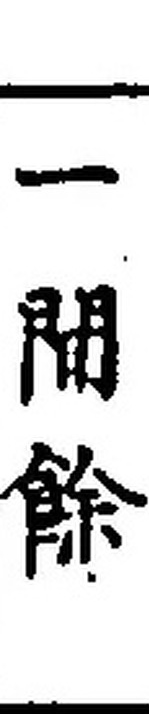一間余
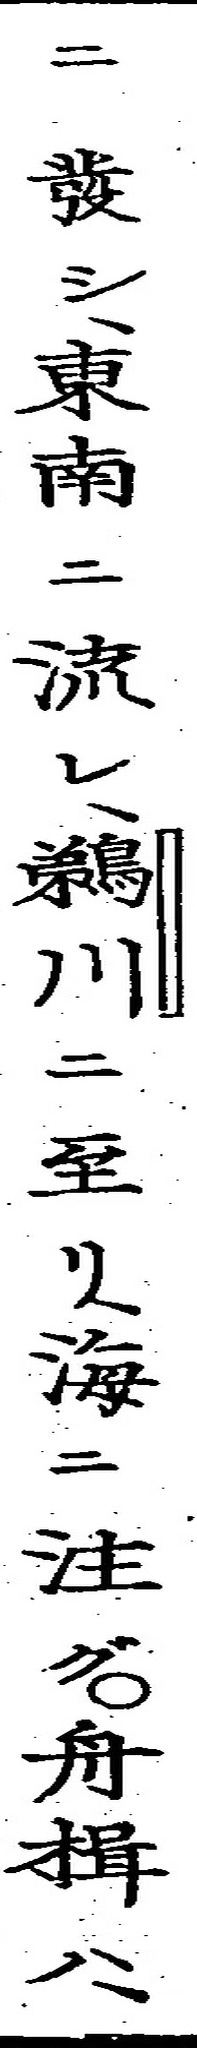ニ発シ、東南ニ流レ、鵜川ニ至リ、海ニ注グ。舟楫ハ、
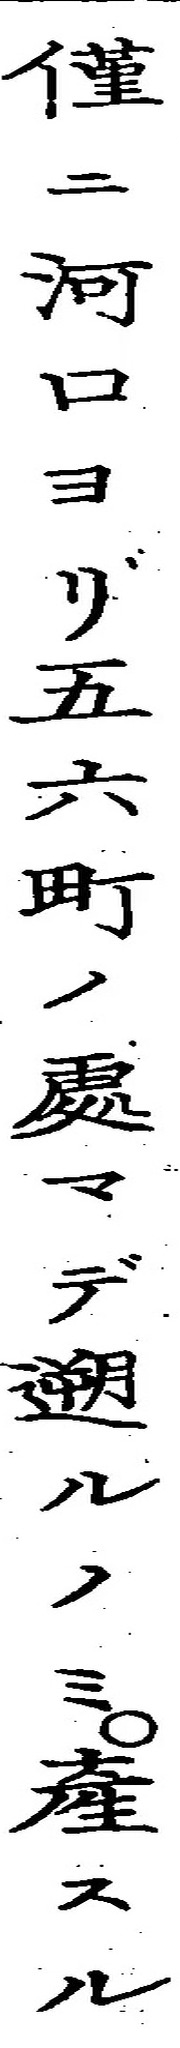僅ニ河口ヨリ五六町ノ処マデ遡ルノミ。産スル
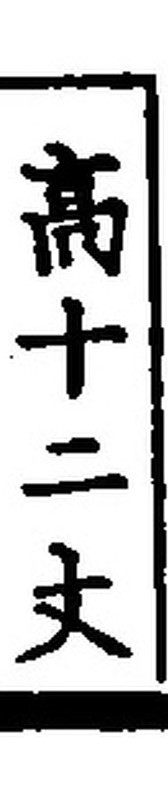高十二丈
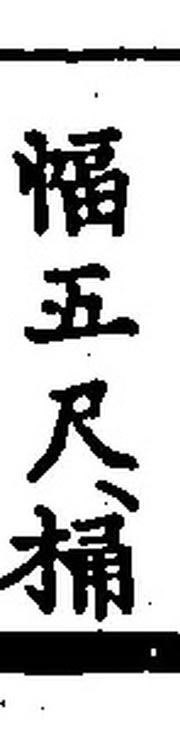幅五尺、桶

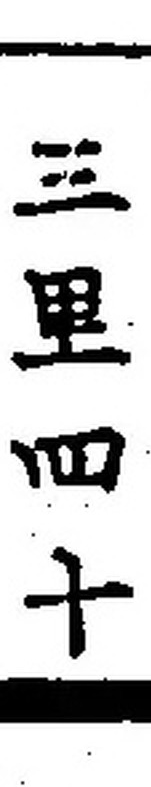三里四十
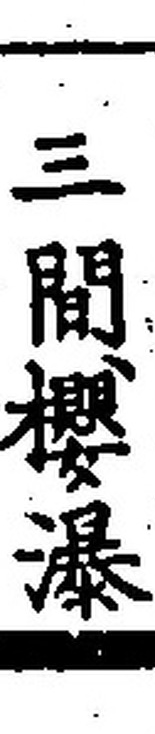三間、桜瀑
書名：能登地誌略
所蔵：国立国会図書館 National Diet Library, JAPAN
